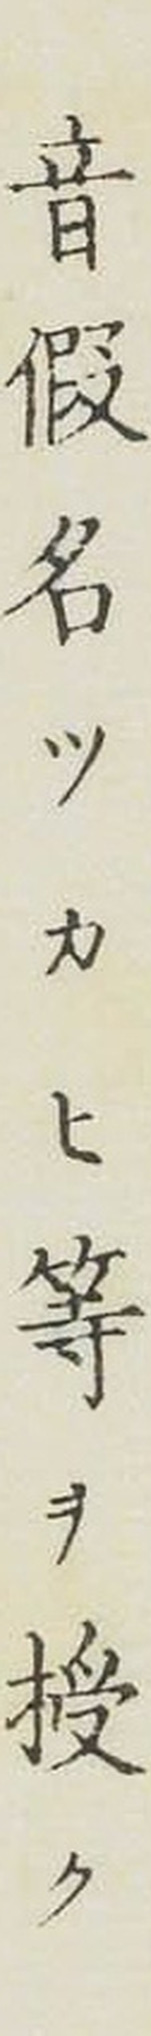音仮名ツカヒ等ヲ授ク
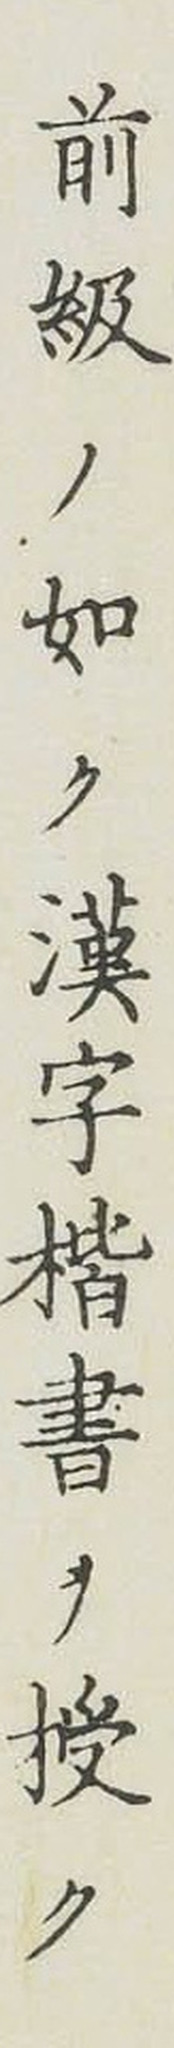前級ノ如ク漢字楷書ヲ授ク
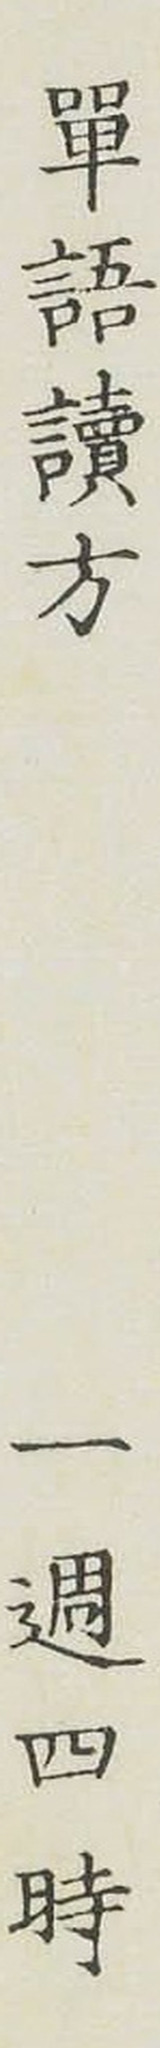単語読方一週四時
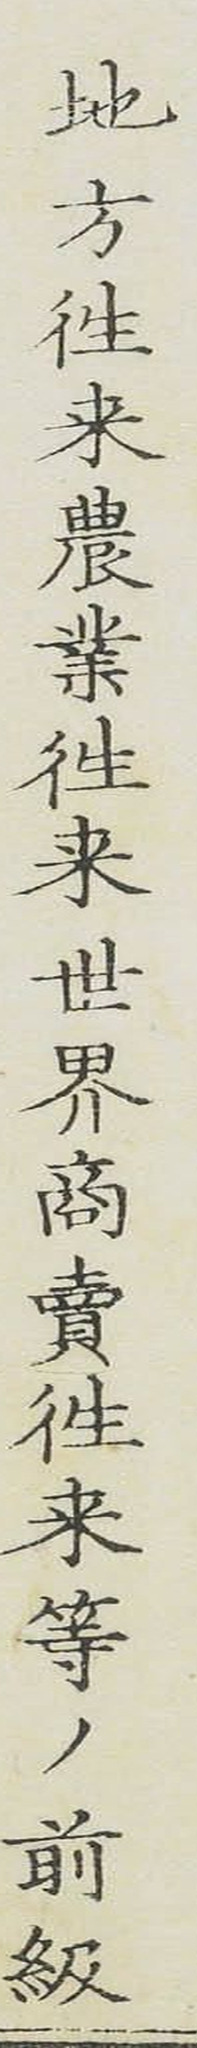地方往来農業往来世界商売往来等ノ前級
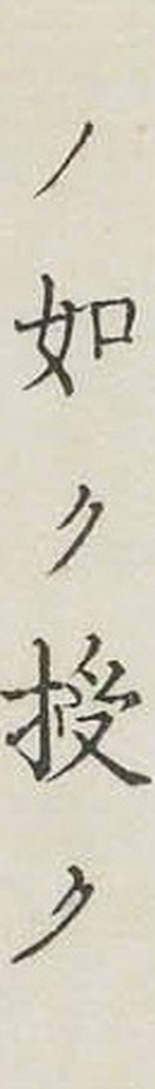ノ如ク授ク
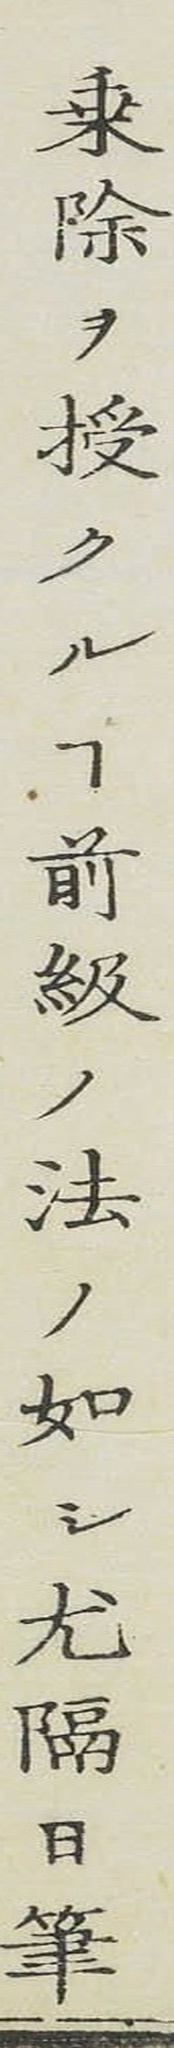乗除ヲ授クルコト前級ノ法ノ如シ尤隔日筆
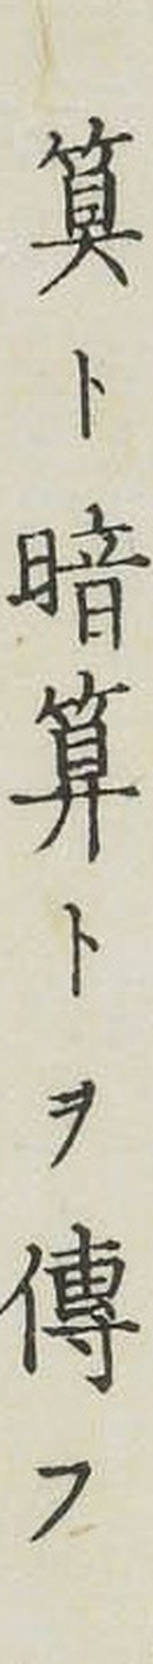算ト暗算トヲ伝フ

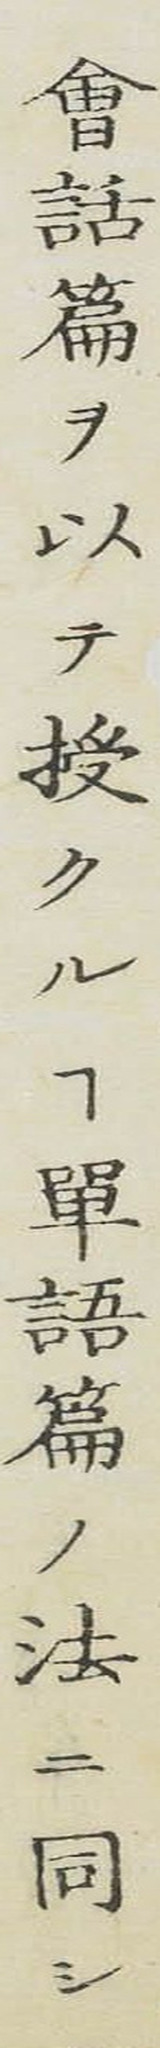会話篇ヲ以テ授クル事単語篇ノ法ニ同シ
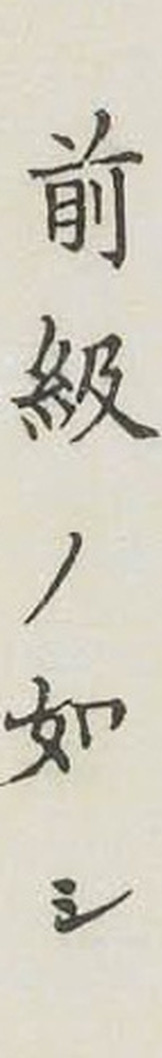前級ノ如シ
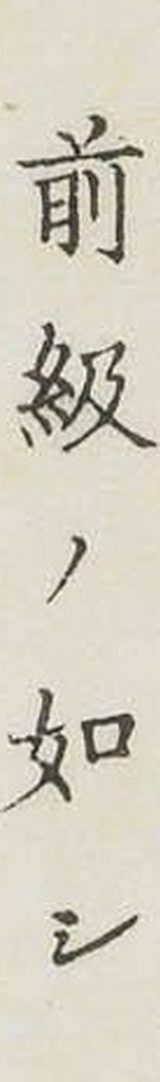前級ノ如シ
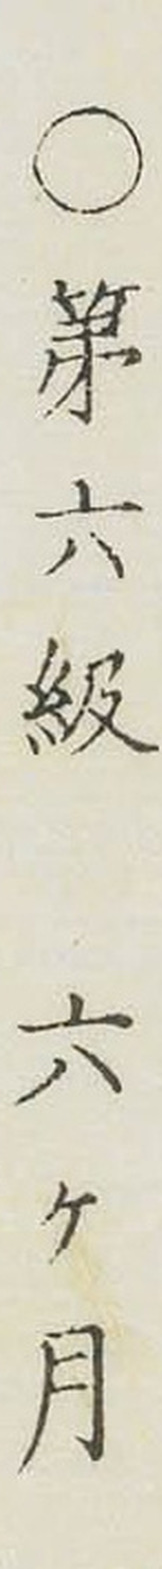○第六級六ケ月
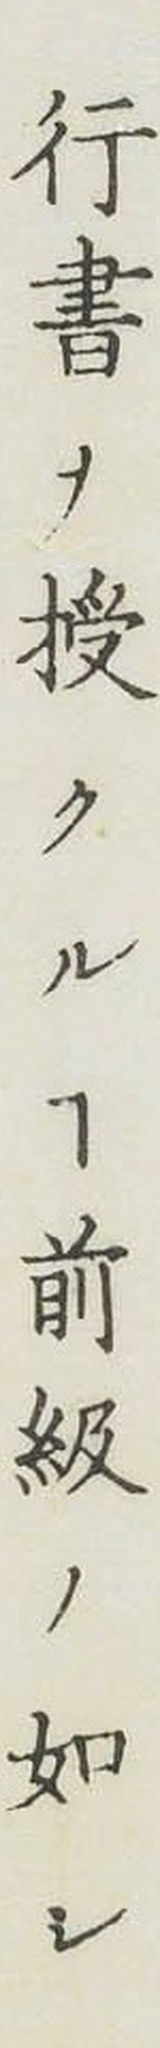行書ヲ授クル事前級ノ如シ
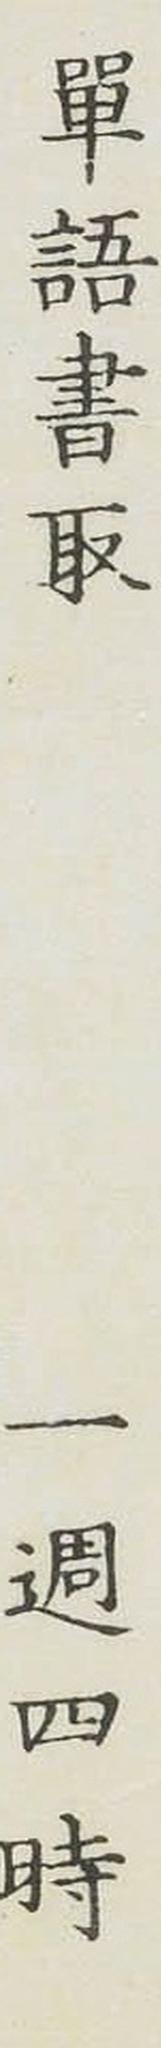単語書取一週四時
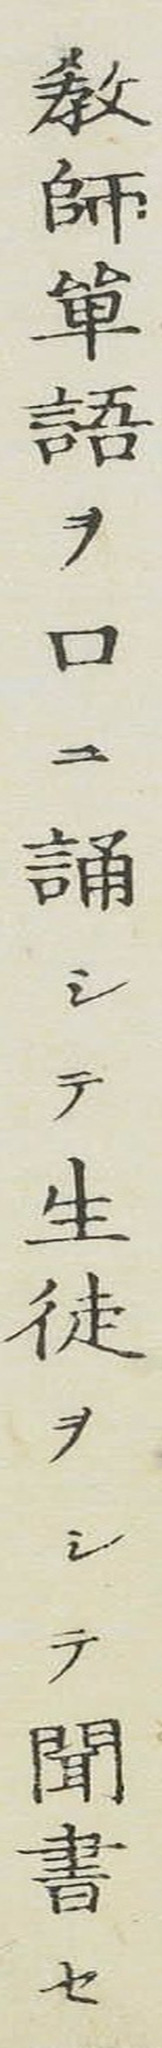教師単語ヲ口ニ誦シテ生徒ヲシテ聞書セ
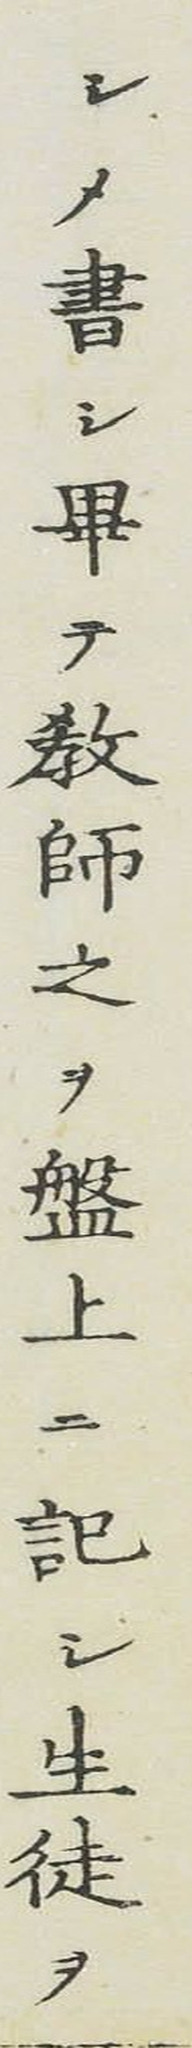シメ書シ畢テ教師之ヲ盤上ニ記シ生徒ヲ
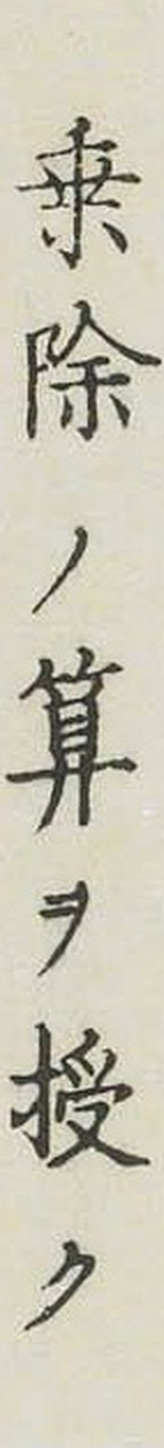乗除ノ算ヲ授ク
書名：小学教則
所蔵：東京学芸大学教育コンテンツアーカイブ
